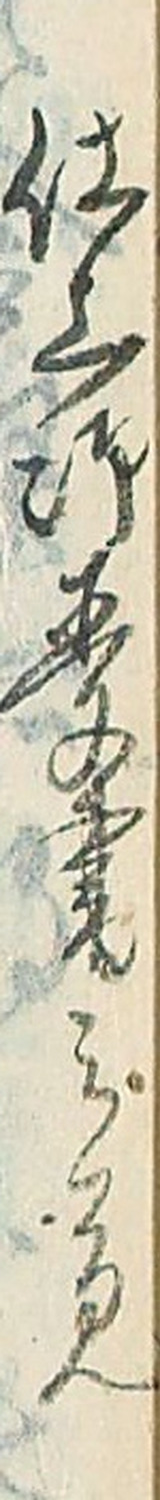仕上御受書之覚
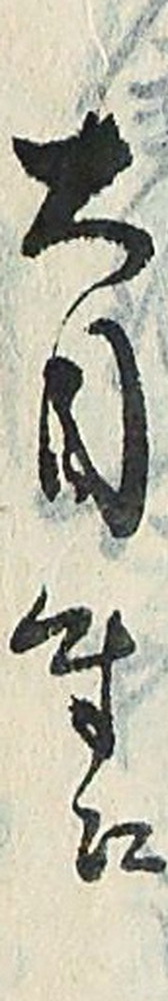大目付江
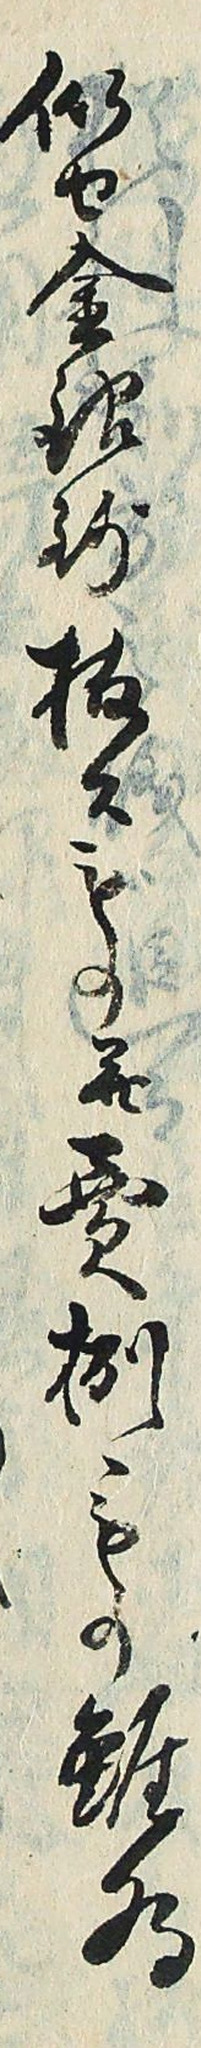似せ金銀銭拵候もの幷売捌候もの雖為
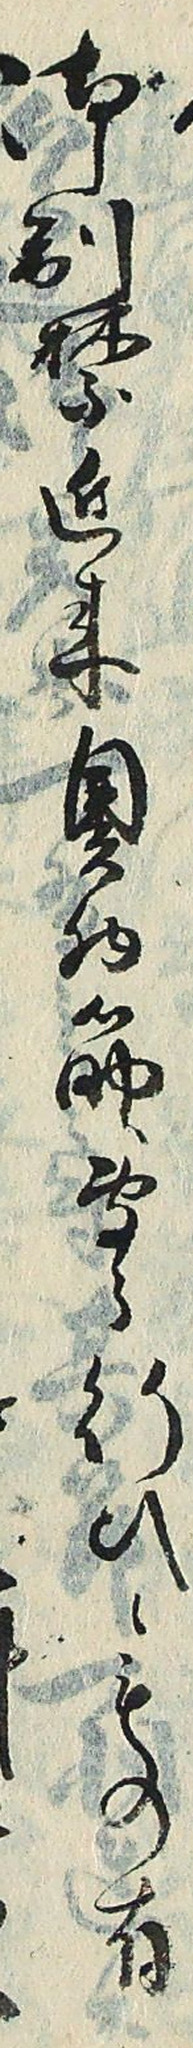御制禁近来奥羽筋へ専ら行ひ候もの有
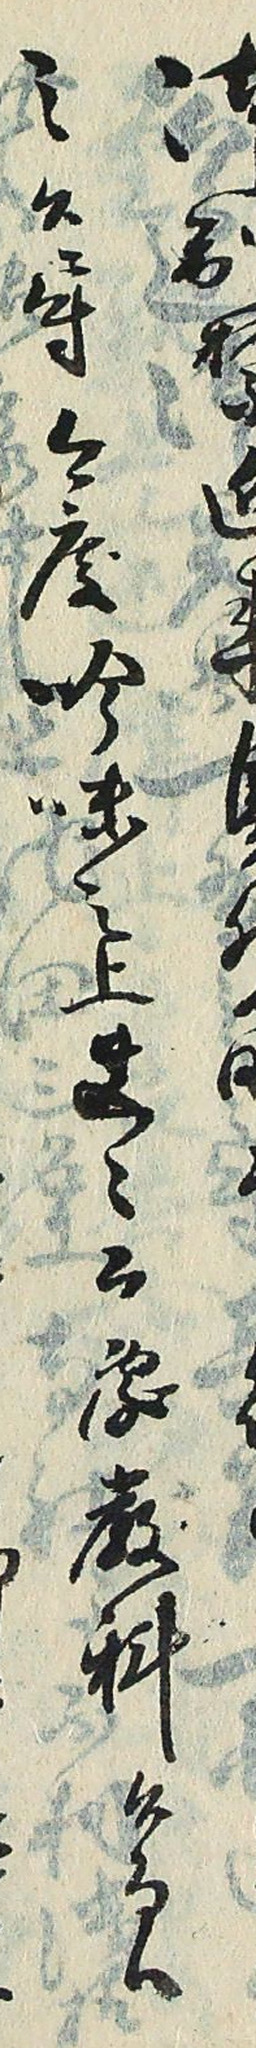之候に付今度吟味之上夫々令処厳科候事而は
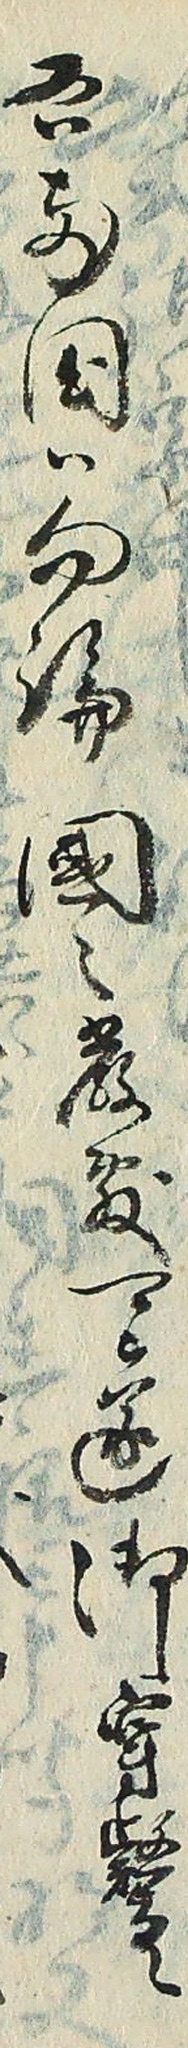右両国は勿論国々厳敷可被遂御穿鑿候
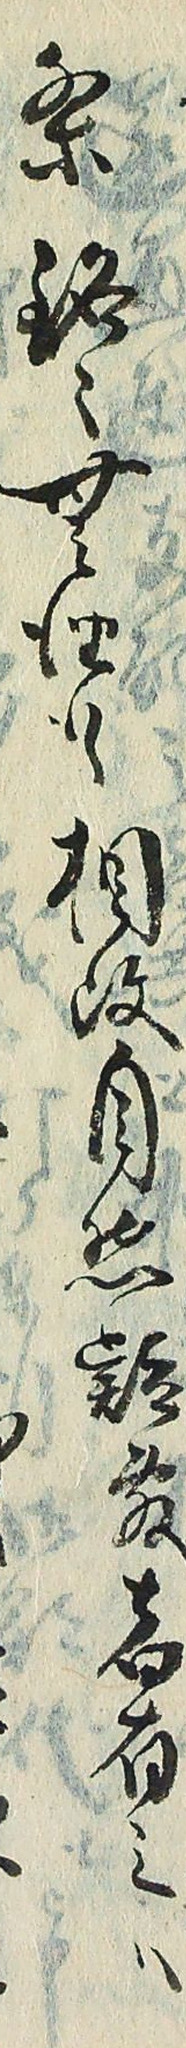条銘々無油断相改自然疑敷者有之は
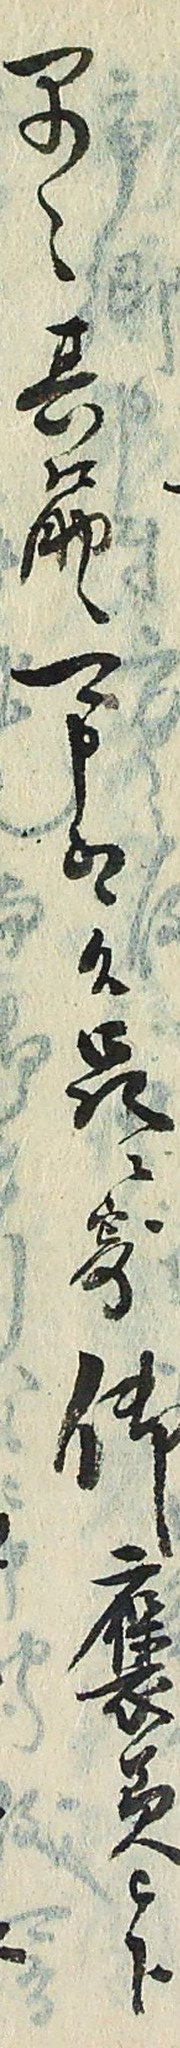早々其筋へ可申出候品に寄御褒美被下
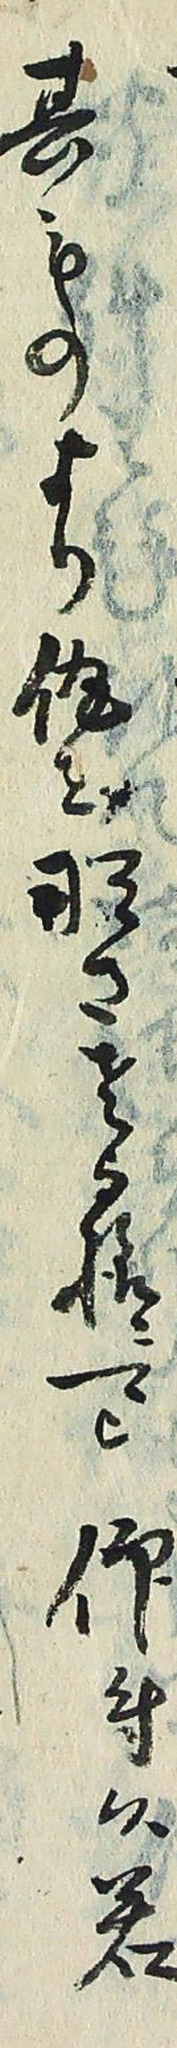其ものより仇をなささる様に可被仰付候若
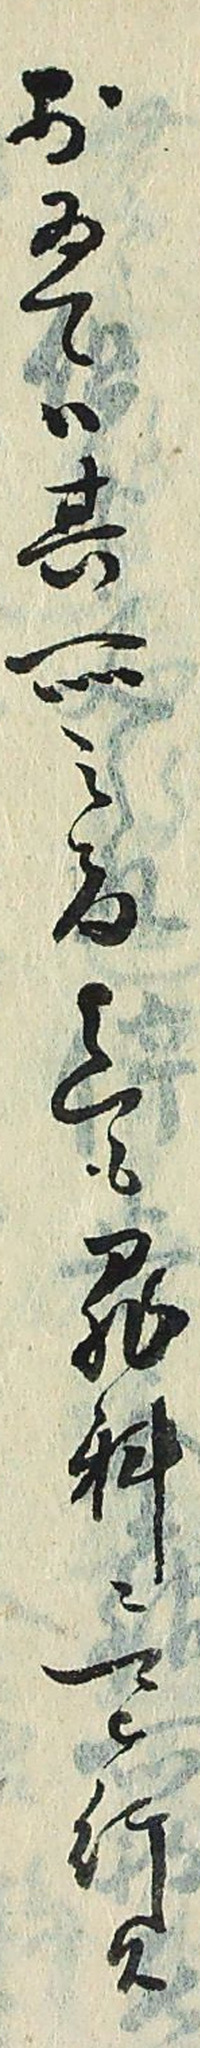おゐては其所之者までも罪科に可被行候
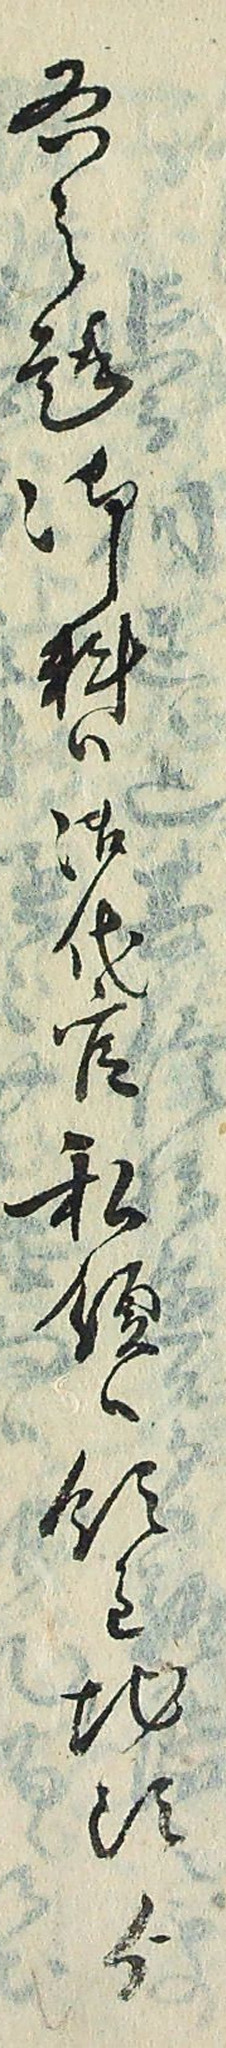右之趣御料は御代官私領は領主地頭ゟ
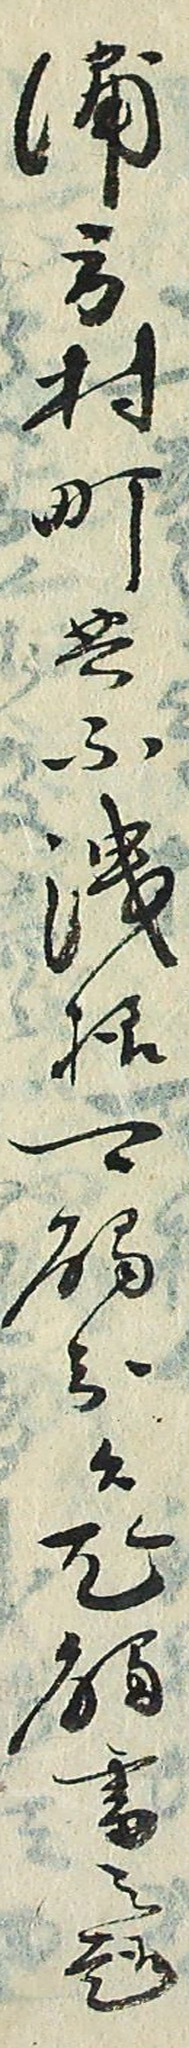浦方村町共不洩様相可触知候尤触書之趣
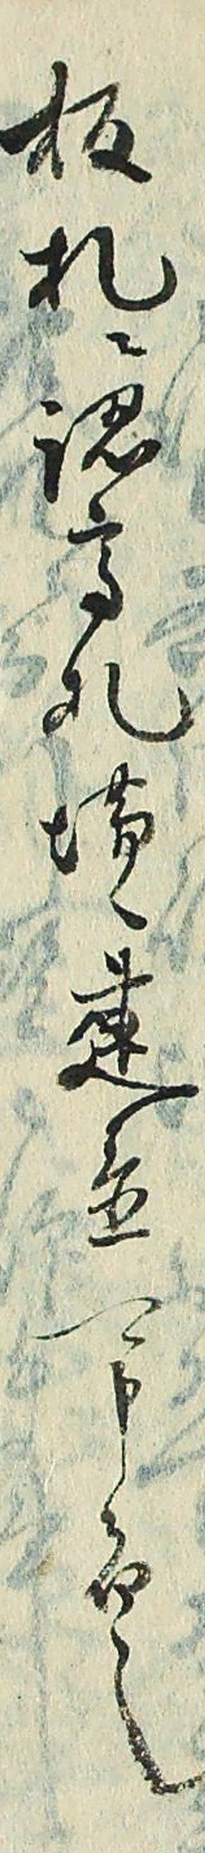板札に認高札場へ建置可申者也
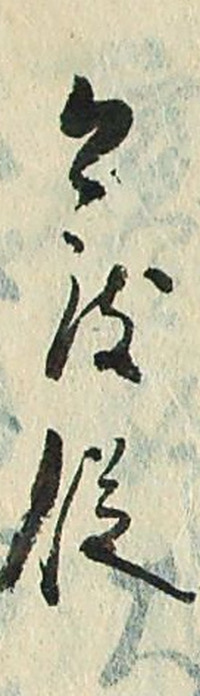今度従
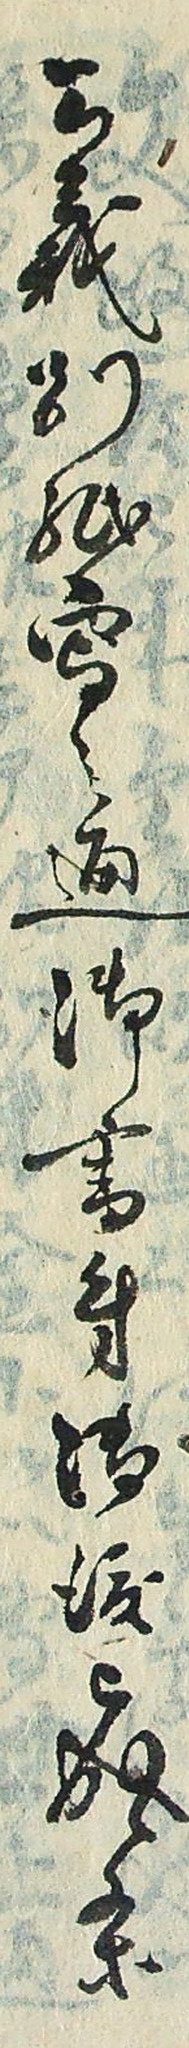公義別紙候写之通御書付御渡被成候条

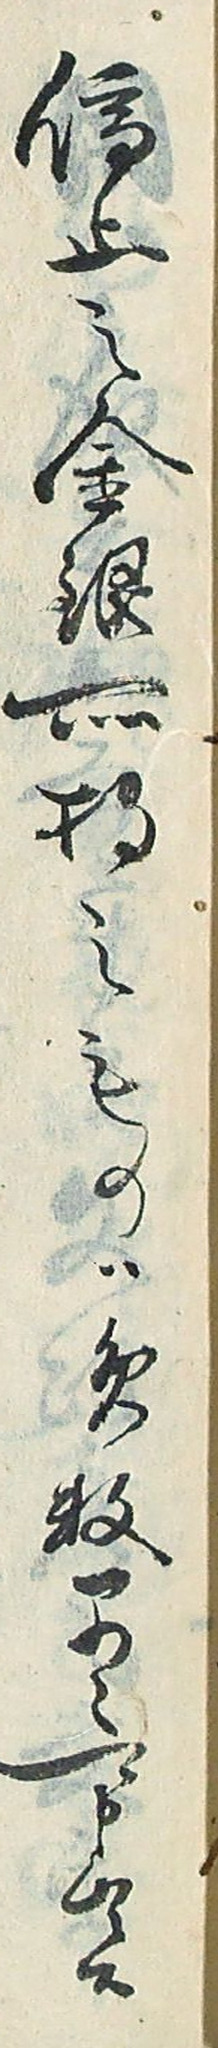停止之金銀所持之ものは員数早々可申出候
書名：諸御用御□受書控
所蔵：鳴門教育大学 Naruto University of Education
